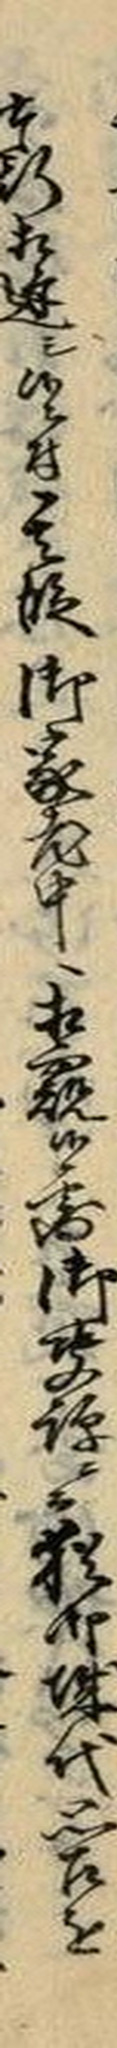奉行相達シ候に付其段御家老中へ相窺候処御決評にて猶御城代思召を
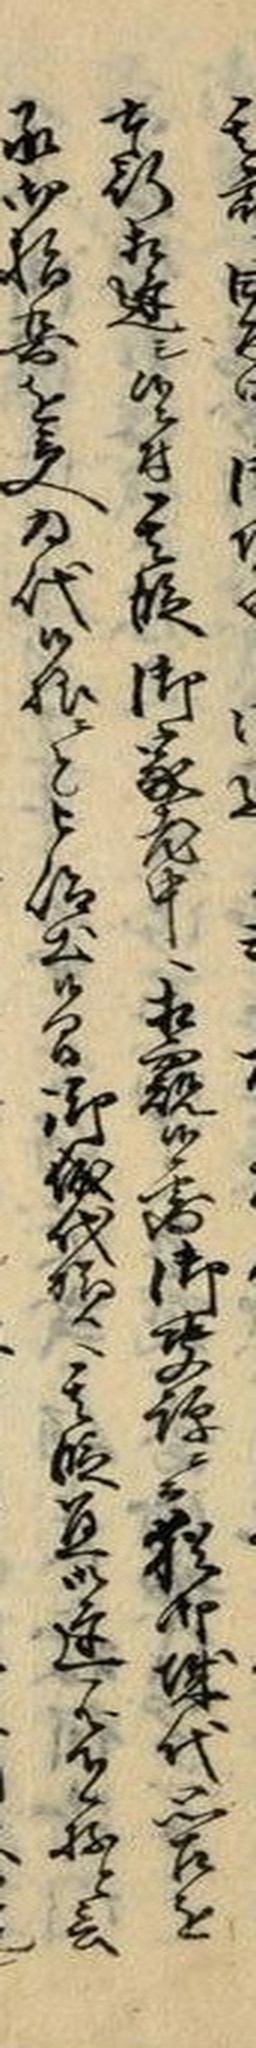承御指図を受為代候様にと被仰出候間御城代様へ其段宜御達可被下候抔と言
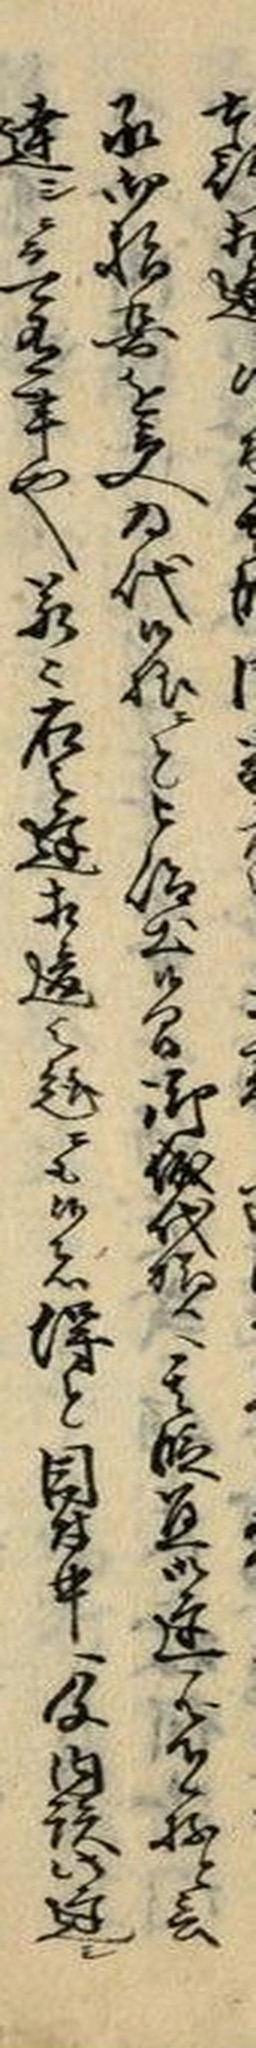達シにて可有事也若々右之達相違之趣にも候は得と目付中へ及内談此達シ
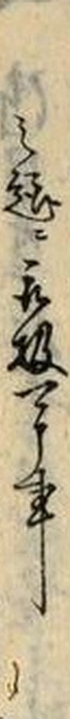之趣に取扱可申事
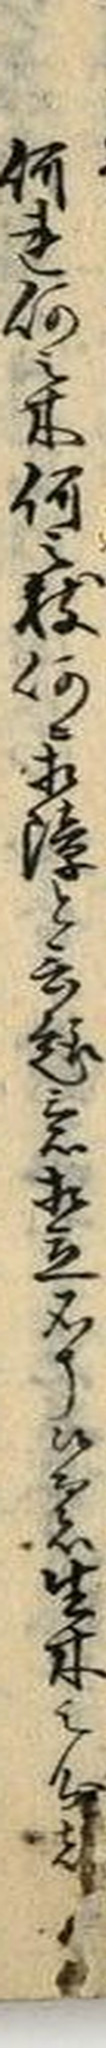何れ何之木何之枝何に相障と言趣意相立不申候ては生木之分は
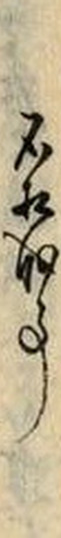不相成事
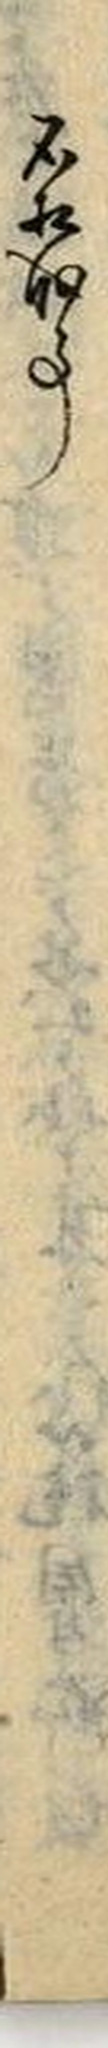不相成事
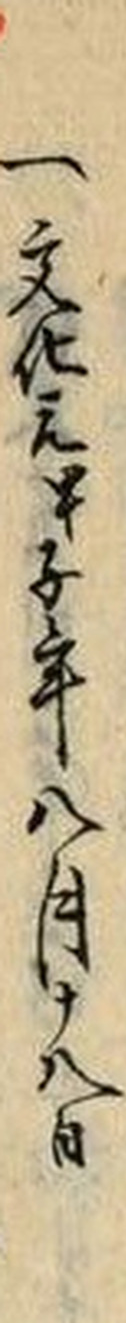一文化元甲子年八月十八日

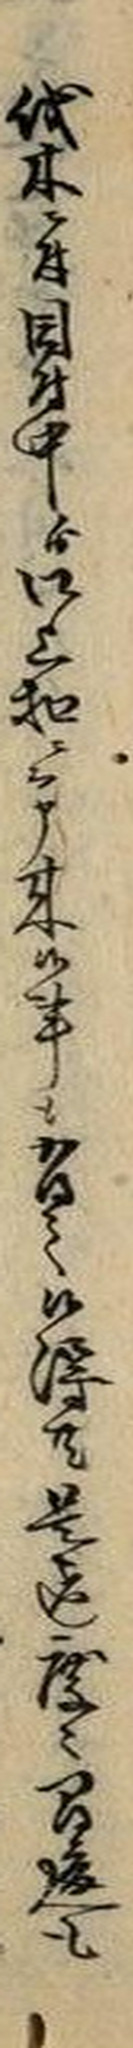伐木に付目付中ゟ口上控にて申来候事も有之候得共是迄度々間違も
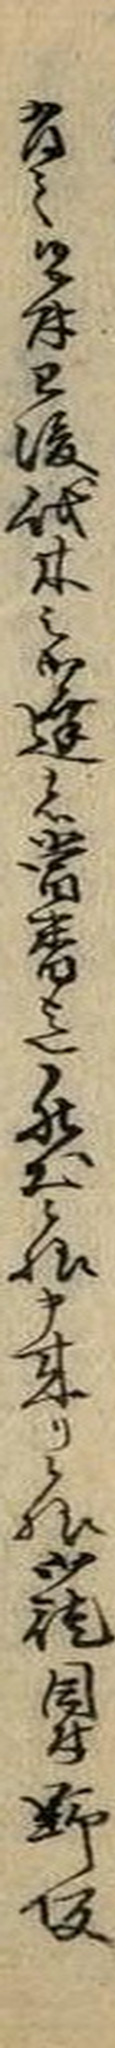有之候に付已後伐木之御達は当番迄罷出候様申来り候様御徒目付野坂
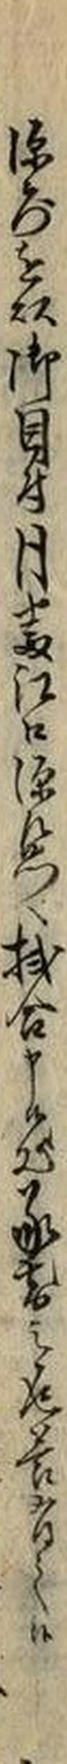源右衛門を以御目付月番江口源左衛門へ掛合申候処承知之返答有之候
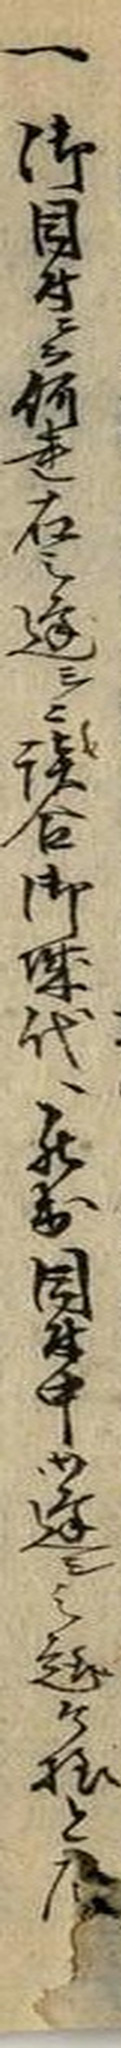一御目付にて何れ右之達シに談合御城代へ罷出目付中御達シ之趣ケ様と
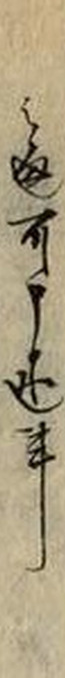之通可申述事
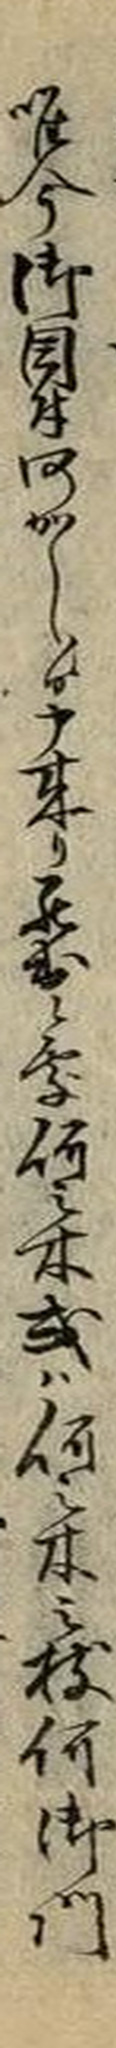唯今御目付何かしゟ申来り罷出候処何之木或は何之木之枝何御門
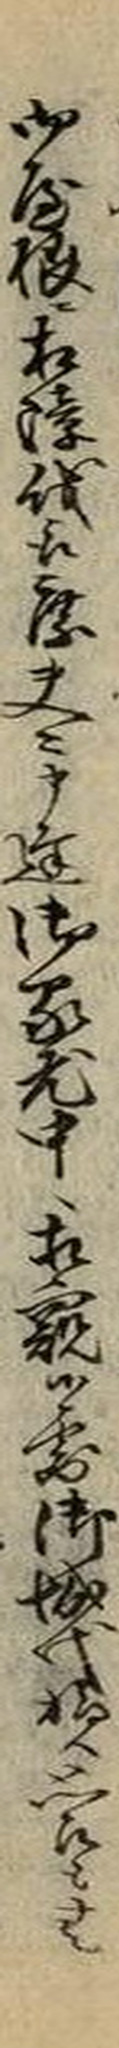御屋根に相障伐取度夫々申達御家老中へ相窺候処御城代様思召も無
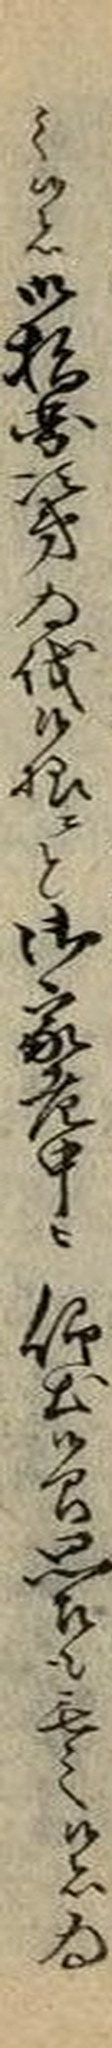之候は御指図次第為伐候様にと御家老中被仰出候間思召も無之候は為
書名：御城下諸事之部
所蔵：福井県文書館 Fukui Prefectural Archives
